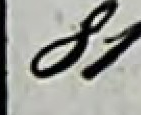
81
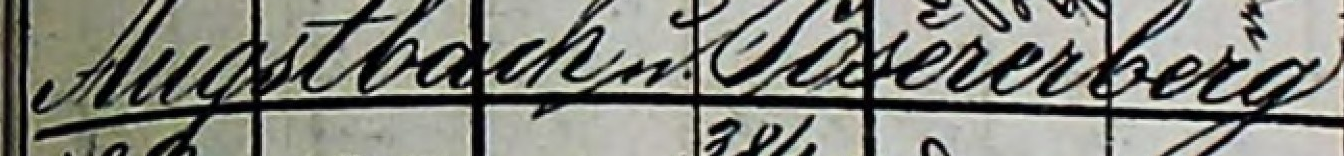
Augstbach u. Posererberg
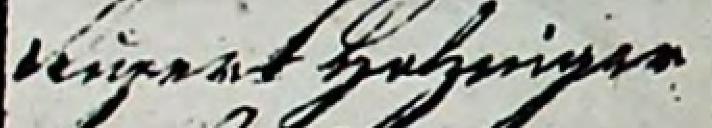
Rupert Holzinger
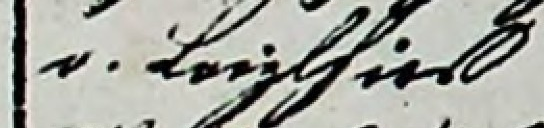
v. Loizlhies
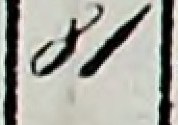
81
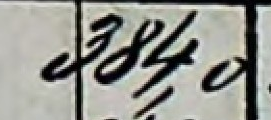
384,0
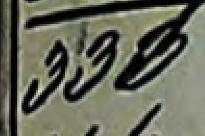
336
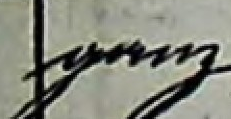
ganz
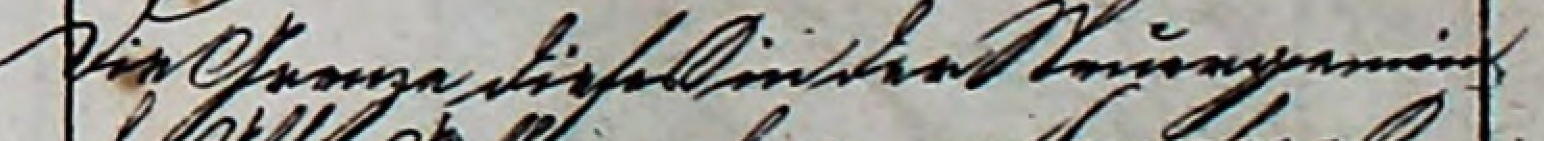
Die Grenze dieses in der Neuergemin„
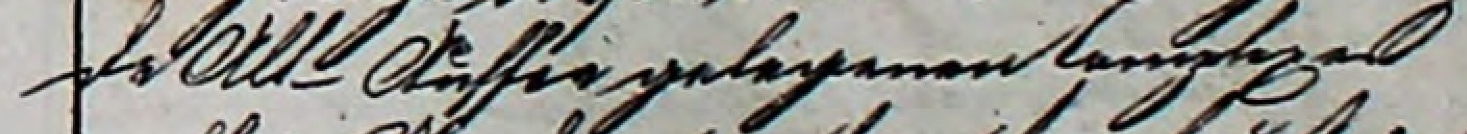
de Alt_Aussee gelegenen Complex as
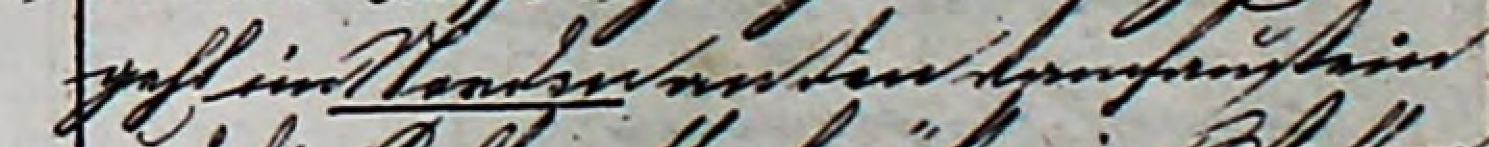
gehl im Norden an den Ramsaustein
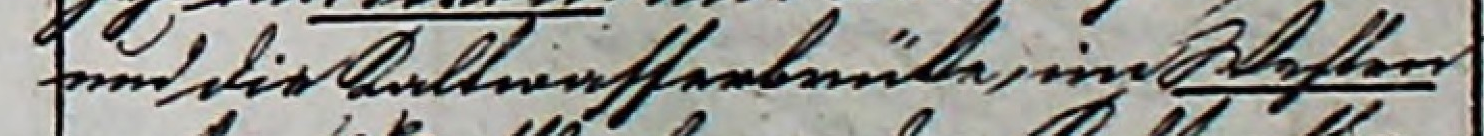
und die Kaltwasserbrüke, im Westen
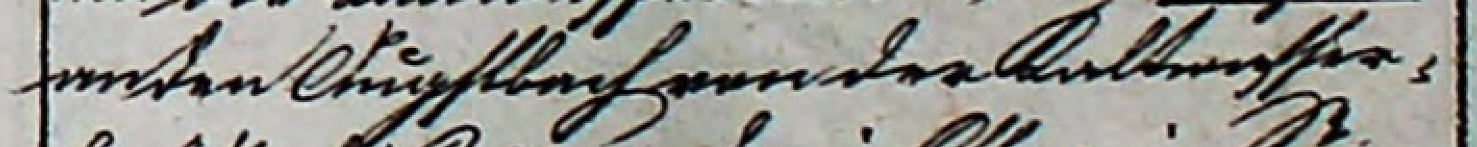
an den Augstbach von der Kaltwasser„
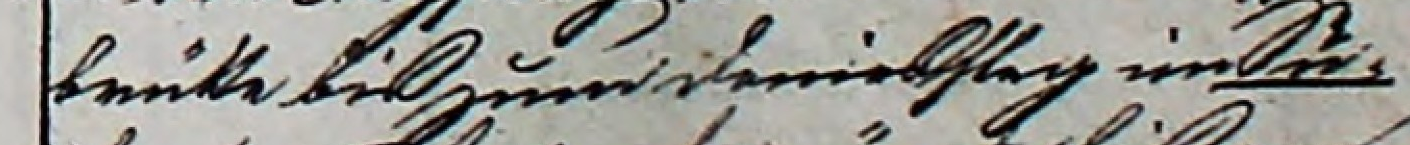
brüke bis um doniesfleg im Su=
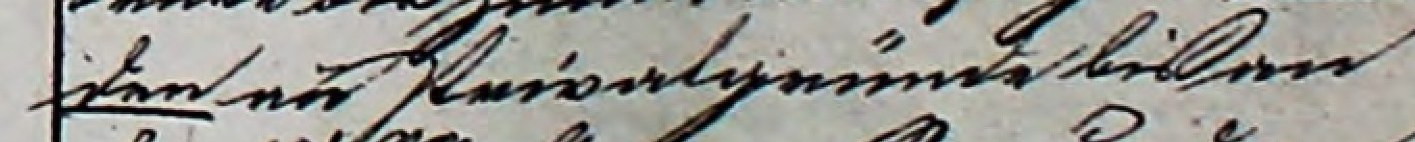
den an Privalgründe bis an
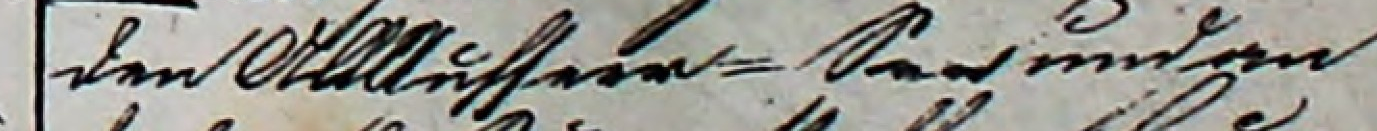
den Alt Ausseer=Sen und an
